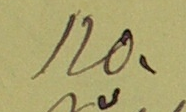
120
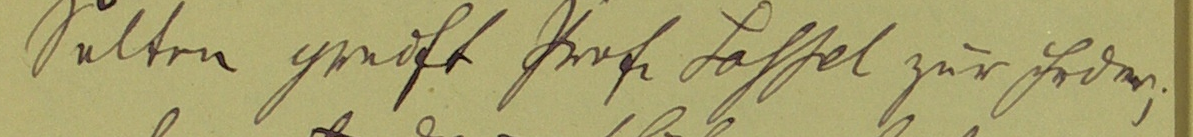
Selten greift Prof. Lassel zur Feder,
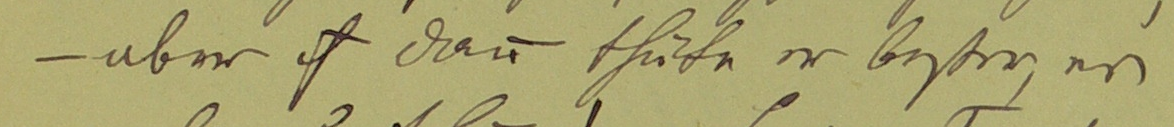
- aber ch dan thäte er besser, es
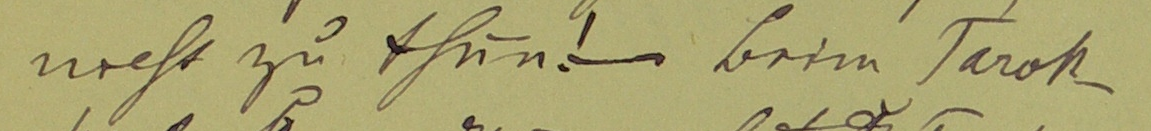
nicht zu thun ! - Beim Tarok¬
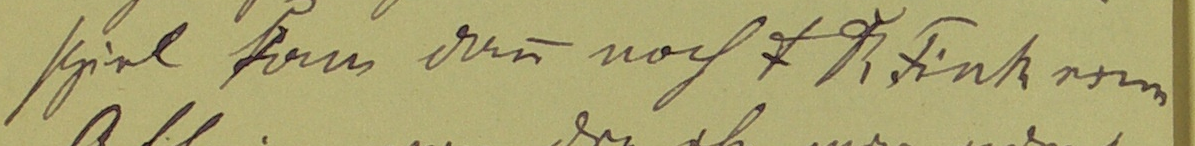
spiel kam dan noch t Dr. Fink eine
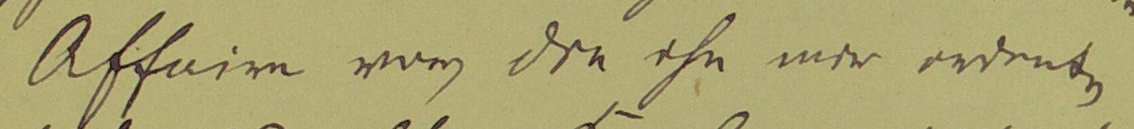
Affaire vor, die ihn mir ordent¬
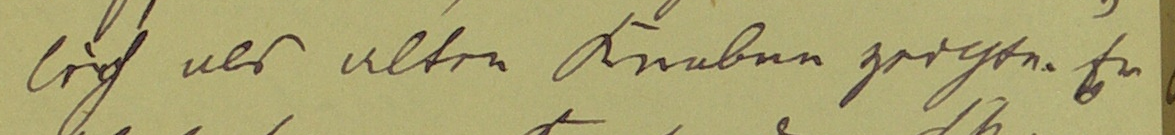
lich als alten Knaben zeigte. Er
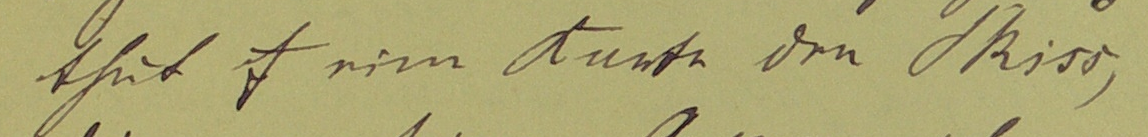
thut f ein Karte die Skiso,
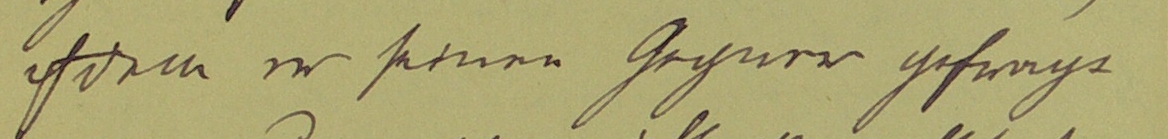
mit dem er seine Gegner gefragt
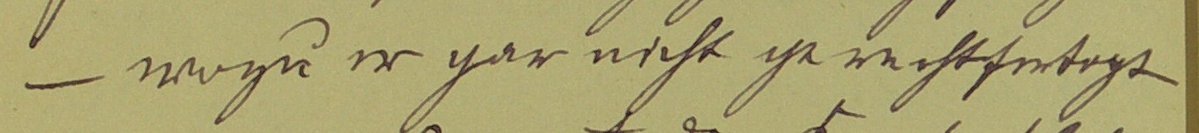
- wozu er gar nicht gerechtfertigt
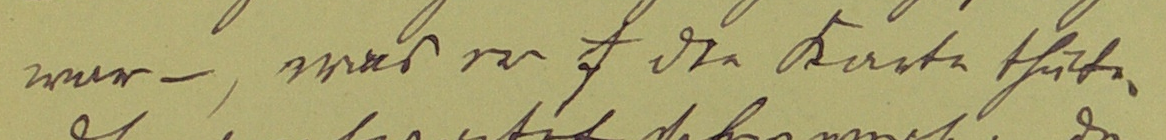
war -, was er t der Karte thäte
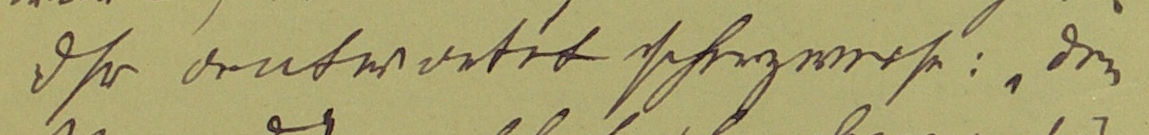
dsr antwortete scherzhaft: „ Den
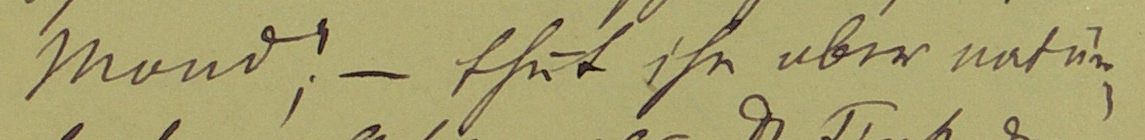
Mond„ - thut ihr aber natür¬
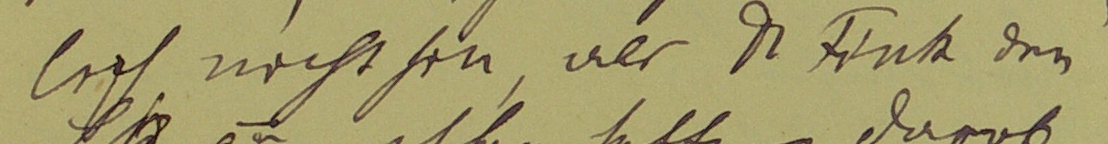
lich nicht hin, als Dr. Fink, den
